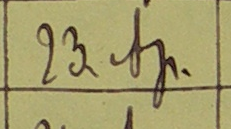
23. April
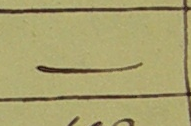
-
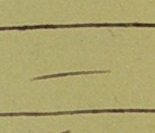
-
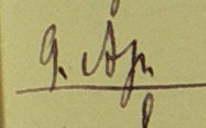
9. April
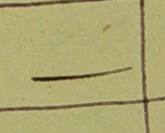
-
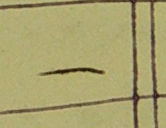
-
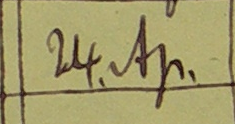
24. April
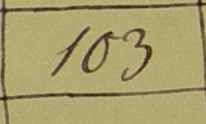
103
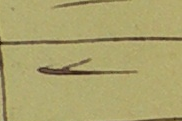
-
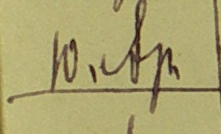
10. April
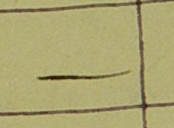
-
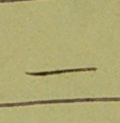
-
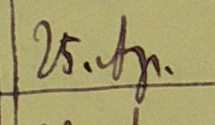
25. April
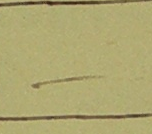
-
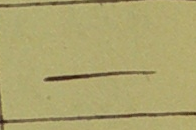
-
